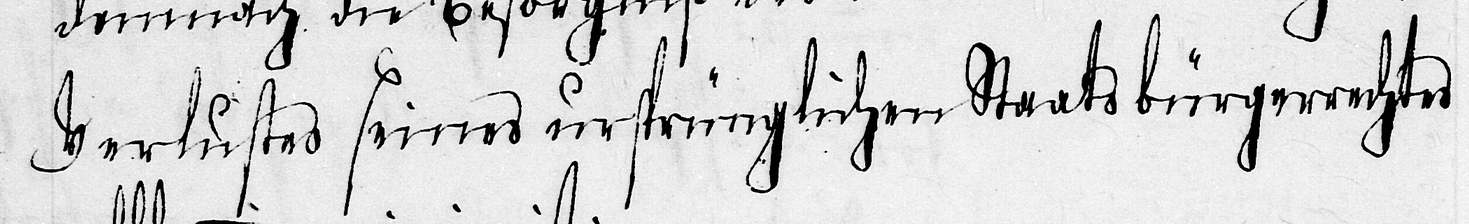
Verlustes seines ursprünglichen Staatsbürgerrechtes
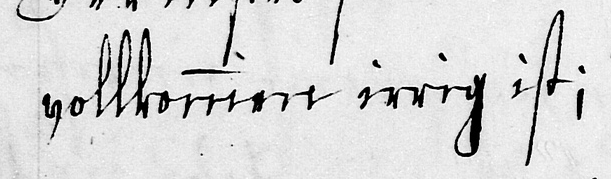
vollkommen irrig ist;
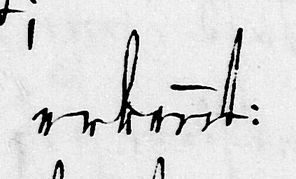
erkennt:
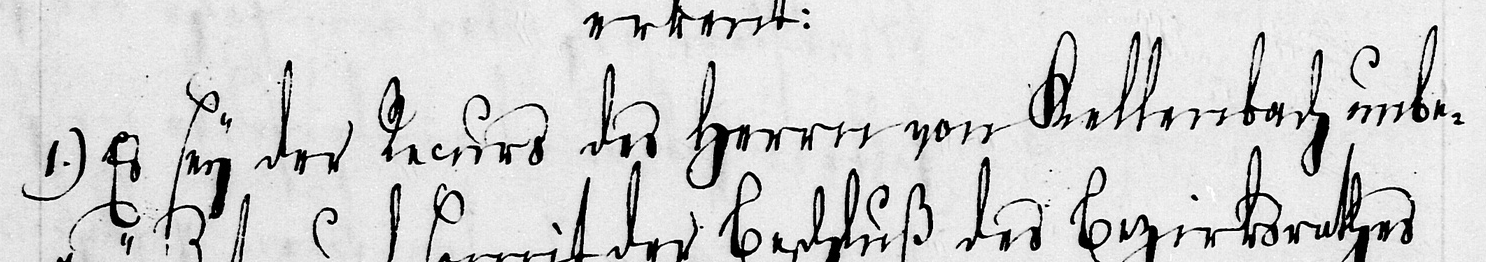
1.) Es sey der Recurs des Herrn von Kellenbach unbe¬
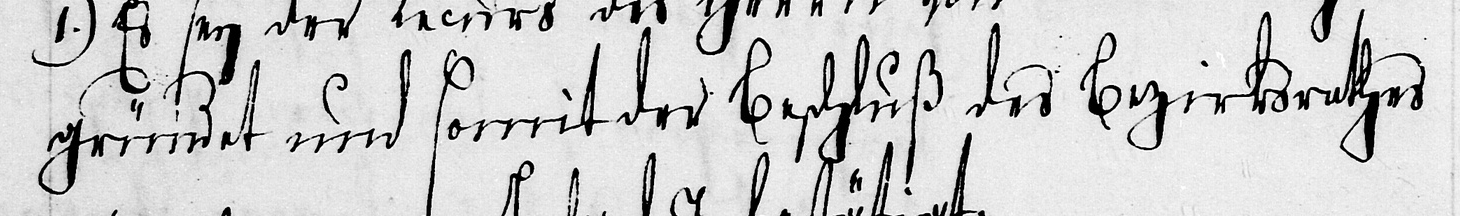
gründet und somit der Beschluß des Bezirksrathes
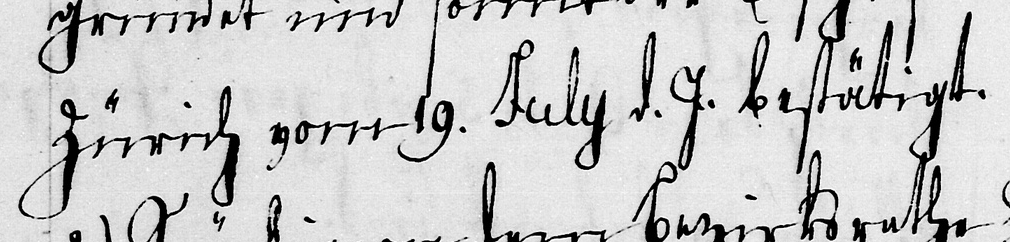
Zürich vom 19. July d. J. bestätigt.
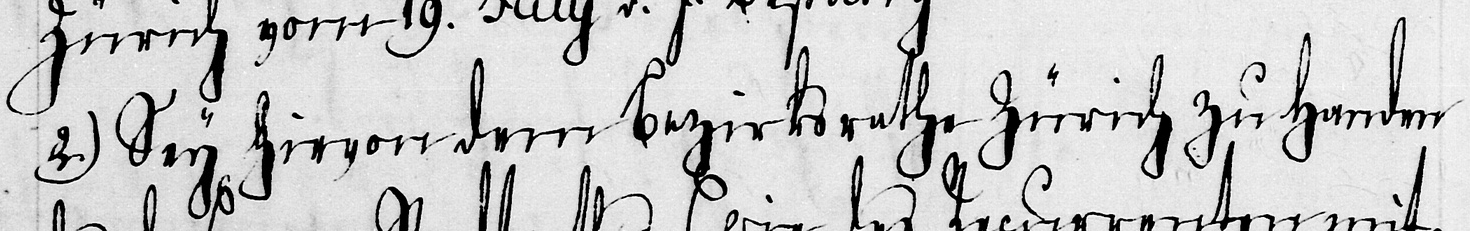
2.) Sey hievon dem Bezirksrathe Zürich zu Handen
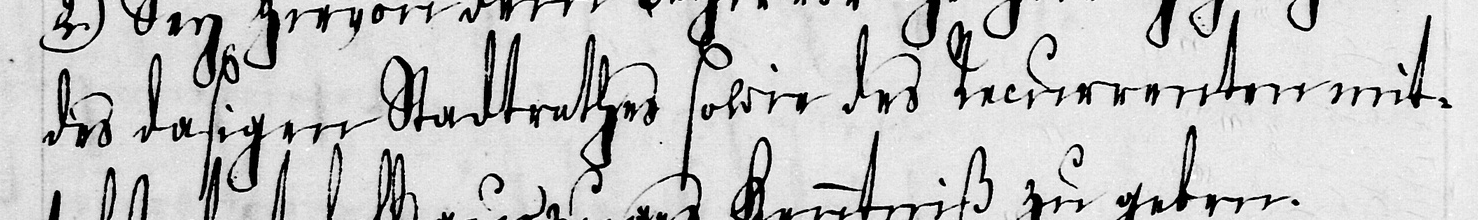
des dasigen Stadtrathes sowie des Recurrenten mit¬
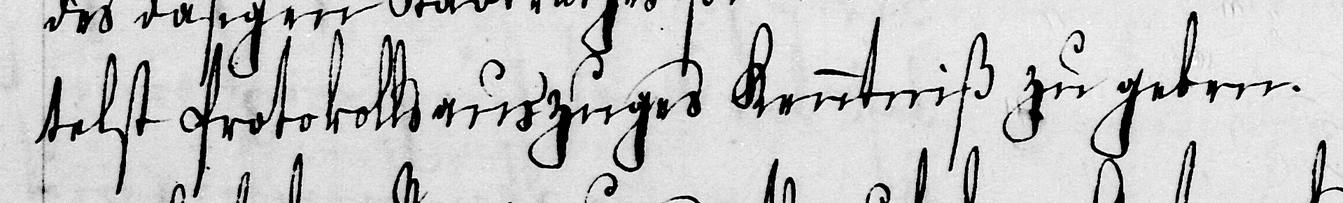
telst Protokollsauszuges Kenntniß zu geben.
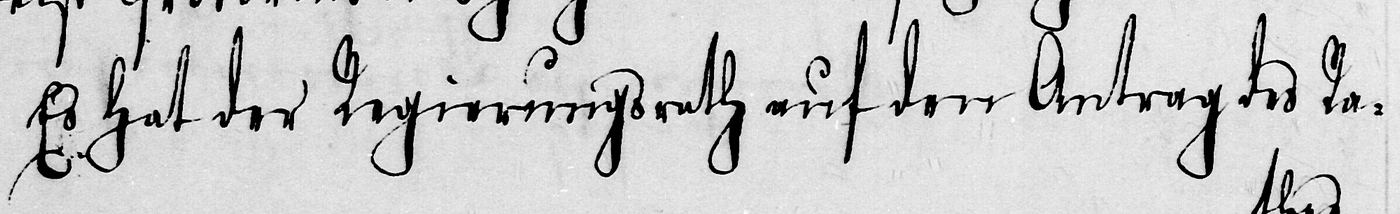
Es hat der Regierungsrath auf den Antrag des Ra-
